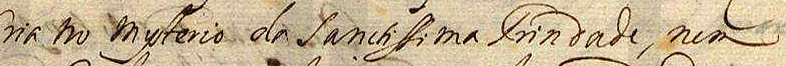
Cria no mysterio da sanctissima Trindade, nem
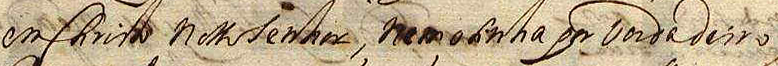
em Christo nosso senhor, nem o tinha per verdadeiro
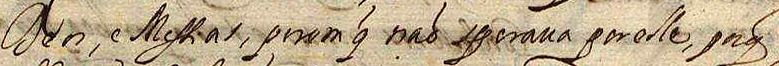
Deos, e Messias, porem q̄ naõ speraua por elle, porq̄
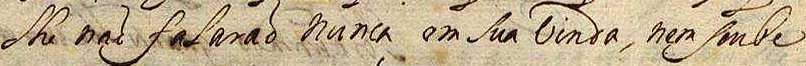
lhe naõ falaraõ nunca em sua vinda, nem soube
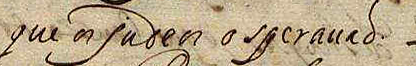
que os judeos o sperauaõ.
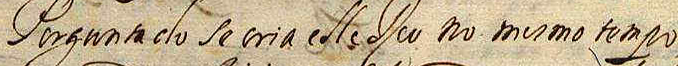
Perguntado se cria elle Reo no mesmo tempo
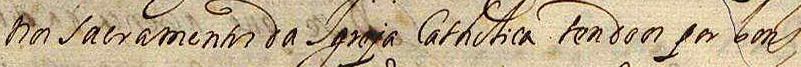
nos sacramentos da Igreja Catholica tendoos por bon̄s,
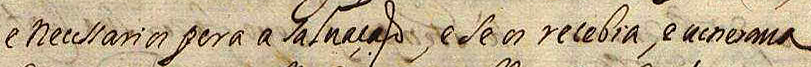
e necessarios pera a saluaçaõ, e se os recebia, e ueneraua
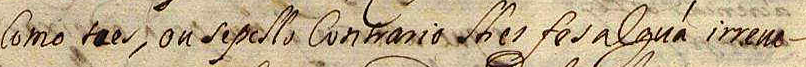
como taes, ou se pello Contrario lhes fes alguā irreue
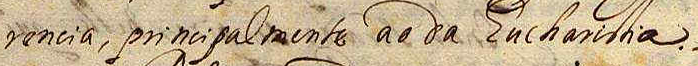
rencia, principalmente ao da Eucharistia.
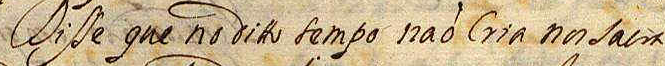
Disse que no ditto tempo naõ cria nos sacra
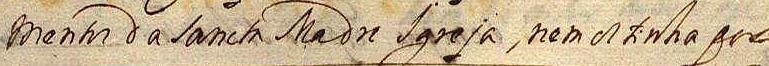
mentos da sancta Madre Igreja, nem os tinha por
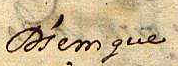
Ds̄ em que
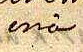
cria
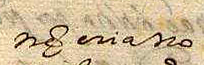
naõ cria no
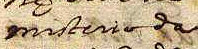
misterio da
